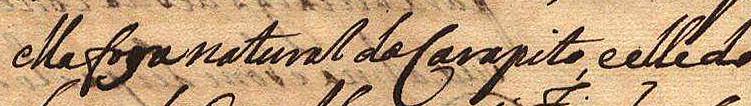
ella fora natural do Carapito, e elle do
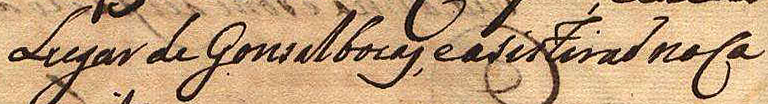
Lugar de Gonsalbozas, e asistiraõ no Ca
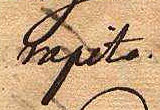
rapito.
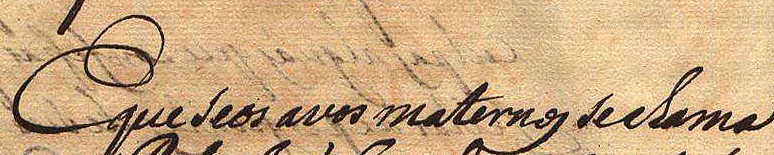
E que seos avos maternos se chama
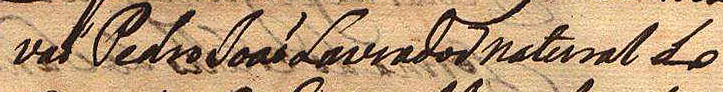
vaõ Pedro Ioaõ Lavrador natural do
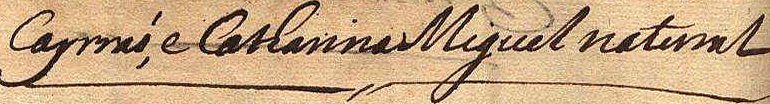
Cayrraõ, e Catharina Miguel natural
